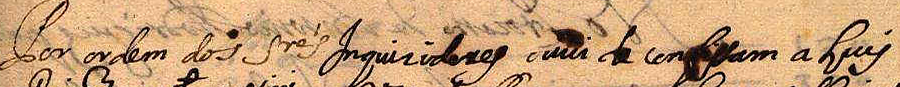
Por ordem dos S.res Jnquizidores ouui a confissam a Luis
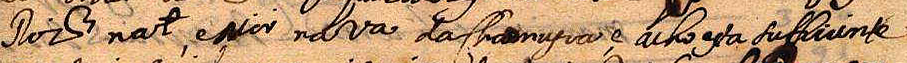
Roiz̄ nal̄, e mor na Va da Chamusca, e acho esta sufficiente
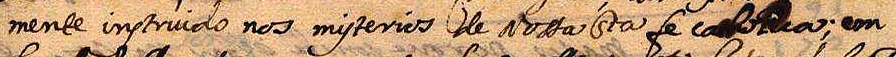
mente instruido nos misterios de Nossa sta fe catholica; em
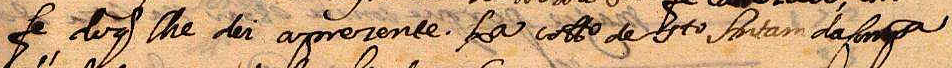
fe do q̄ lhe dei a prezente. Lxa coll̄o de Sto Antam da Compa
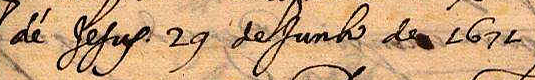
de Jesus. 29 de Junho de 1671
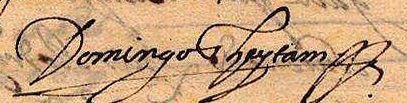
Domingos Leytam
